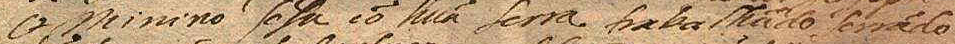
& Minino Jesu cō huā serra trabalhādo serrādo
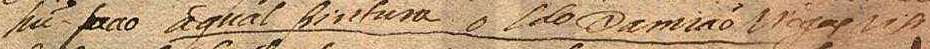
hū pao a qual pintura o ldo Damiaõ Viegas visi
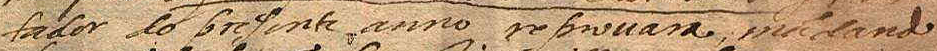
tador do presente anno reprouara, mādando
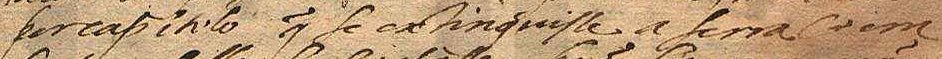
por capitolo q̄ se extinguisse a serra & em
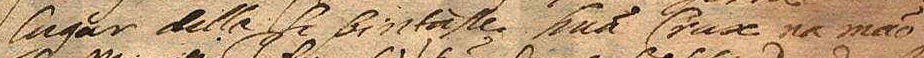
lugar della se pintasse huā Crux na maõ
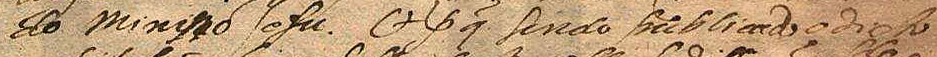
do minino Jesu & p̄ q̄ sendo publicado o dicto
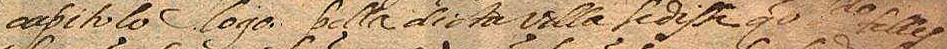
capitolo logo pella dicta villa se disse q̄ o ldo telles
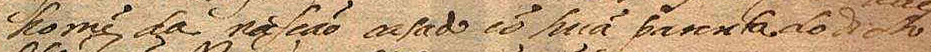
homē da nasçaõ casado cō huā parenta do dicto
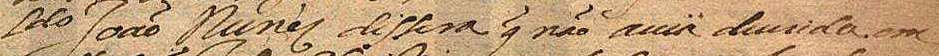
ldo Joaõ Nunes dissera q̄ não auia duuida em
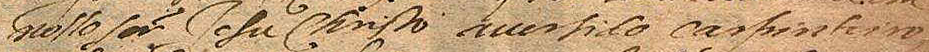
nosso sor̄ Jesu Christo auer sido carpinteiro
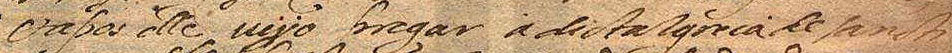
& apos elle ueyo pregar a dicta Igreia de sancti
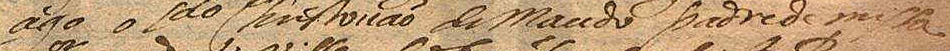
ago o ldo Christouaõ de macedo padre de missa
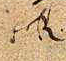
o R.
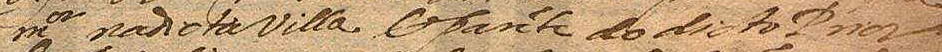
mor na dicta villa & parēte do dicto Prior
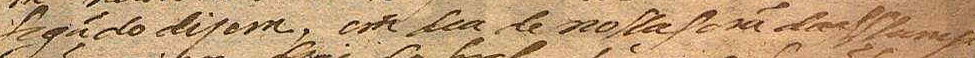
segūdo dizem, em dia de nossa sorā da assump
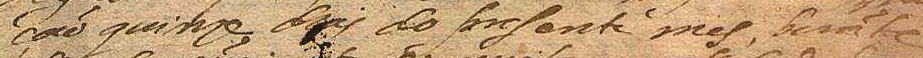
çaõ quinze dias do presente mes, perāte
